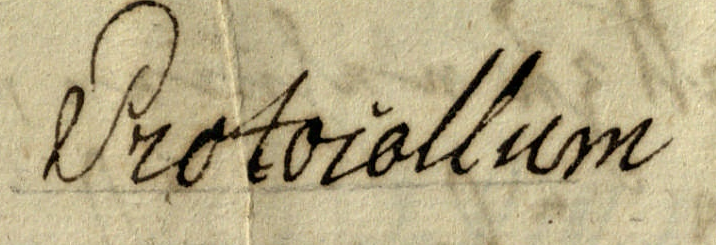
Protocollum
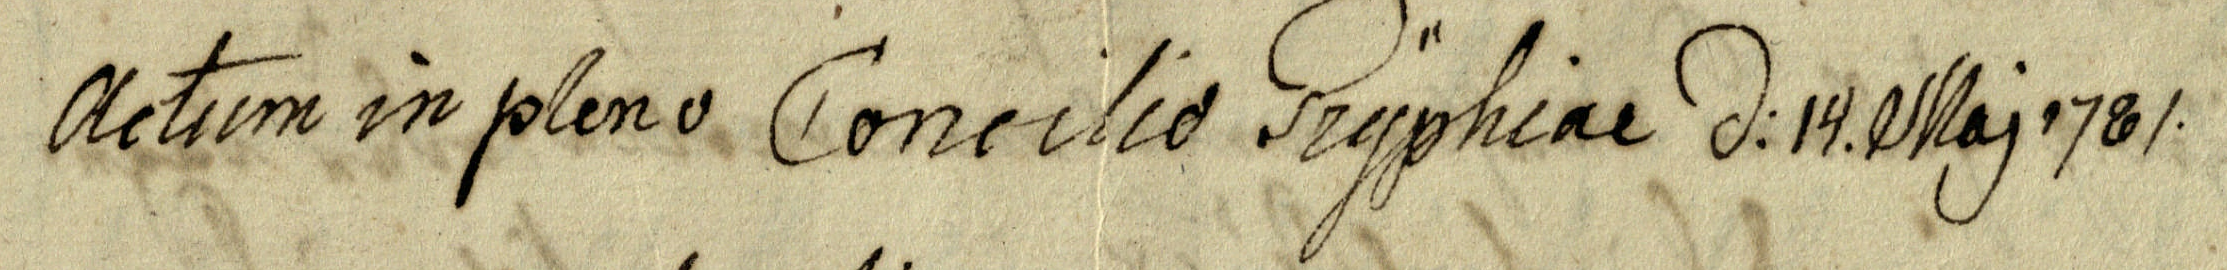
Actum in pleno Concilio Grÿphiae d: 14. Maj 1781
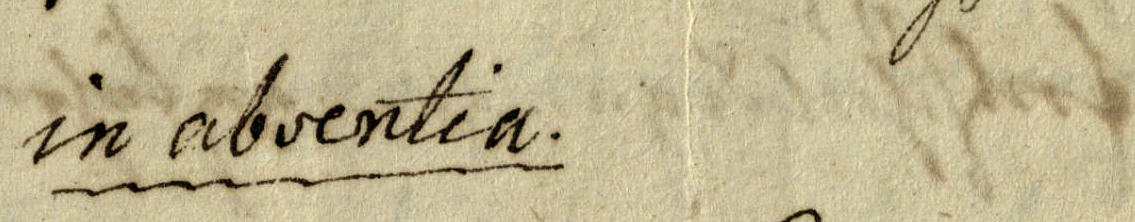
in absentia.
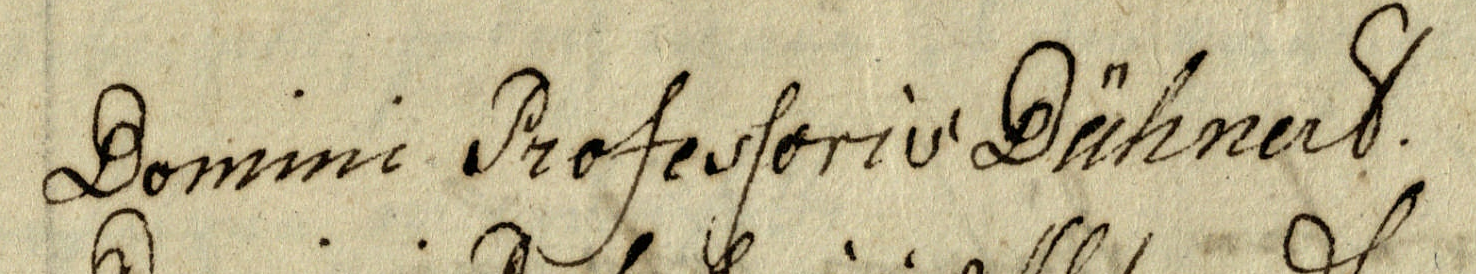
Domini Professoris Dähnert.
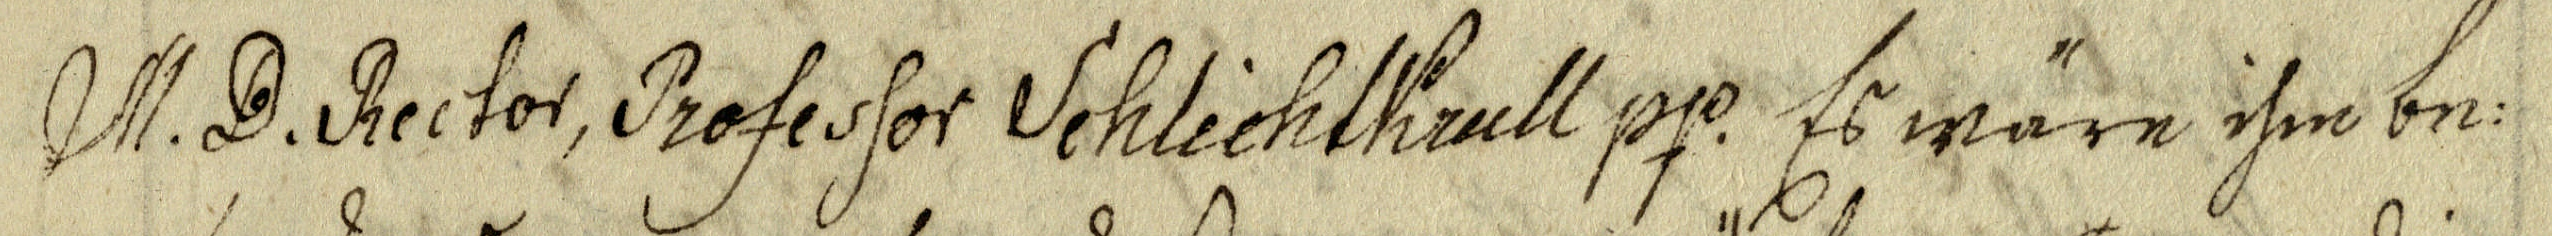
M. D. Rector, Professor Schlichtkrull pp. Es wäre ihm be¬
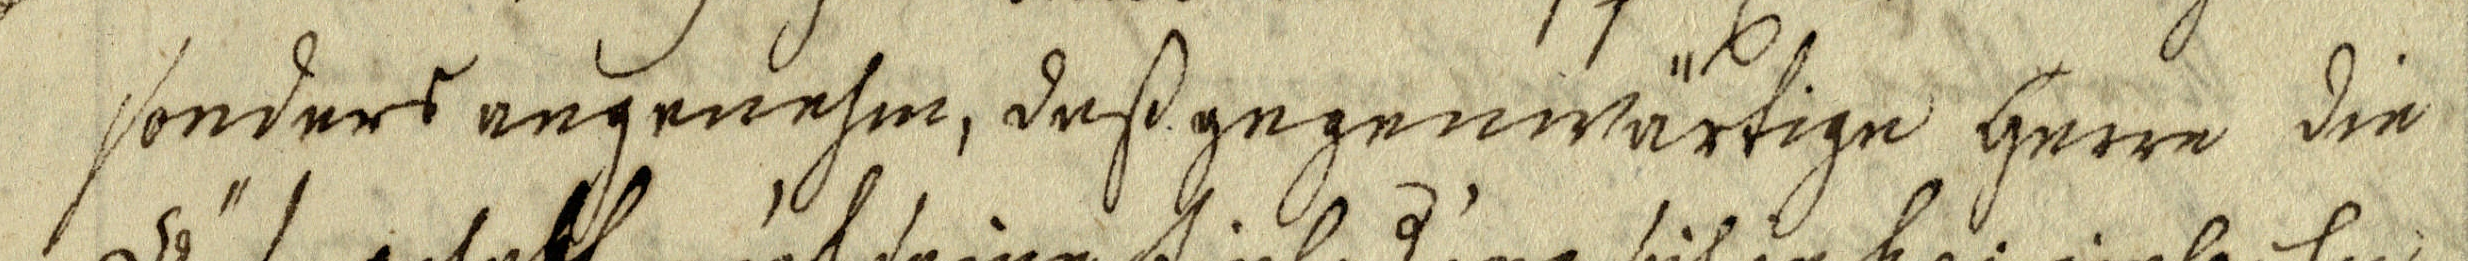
sonders angenehm, daß gegenwärtige Herrn die
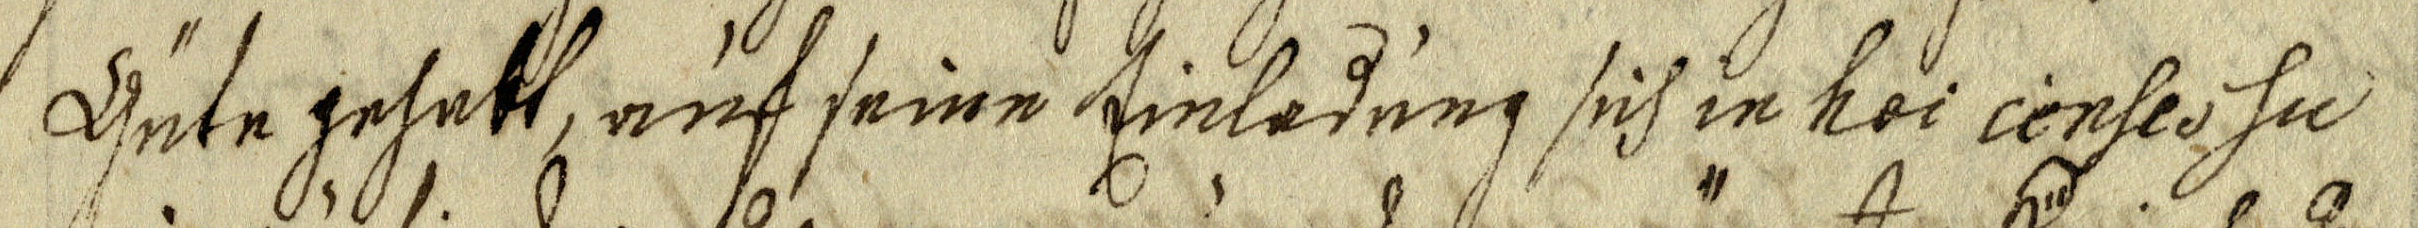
Güte gehabt, auf seine Einladung sich in hoc consessu
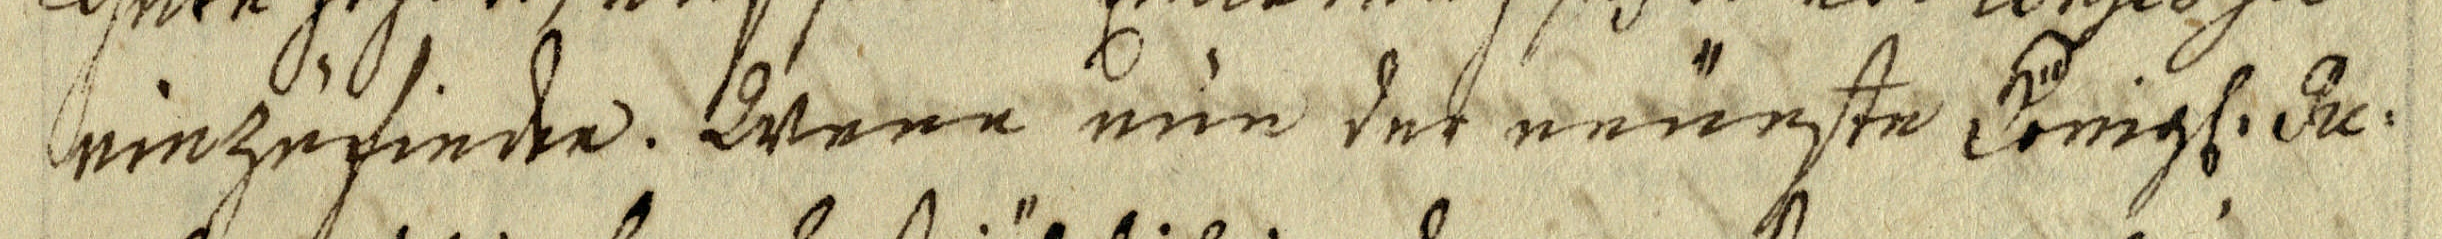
einzufinden. Wenn nun der neueste Königl: Re¬
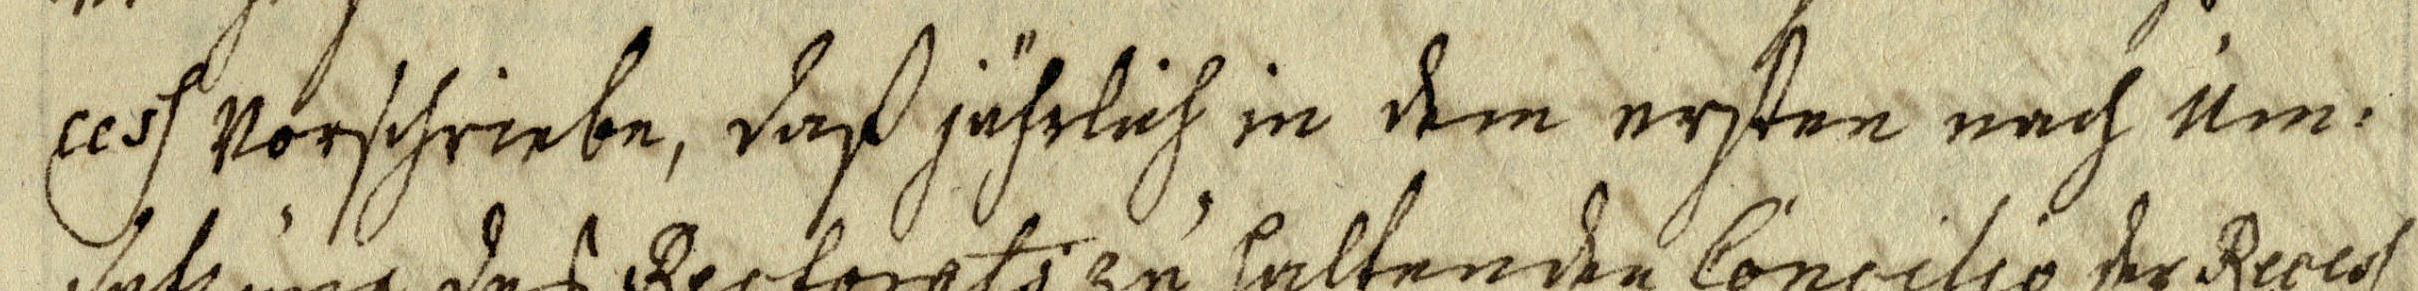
cess vorschriebe, daß jährlich in dem ersten nach Um¬
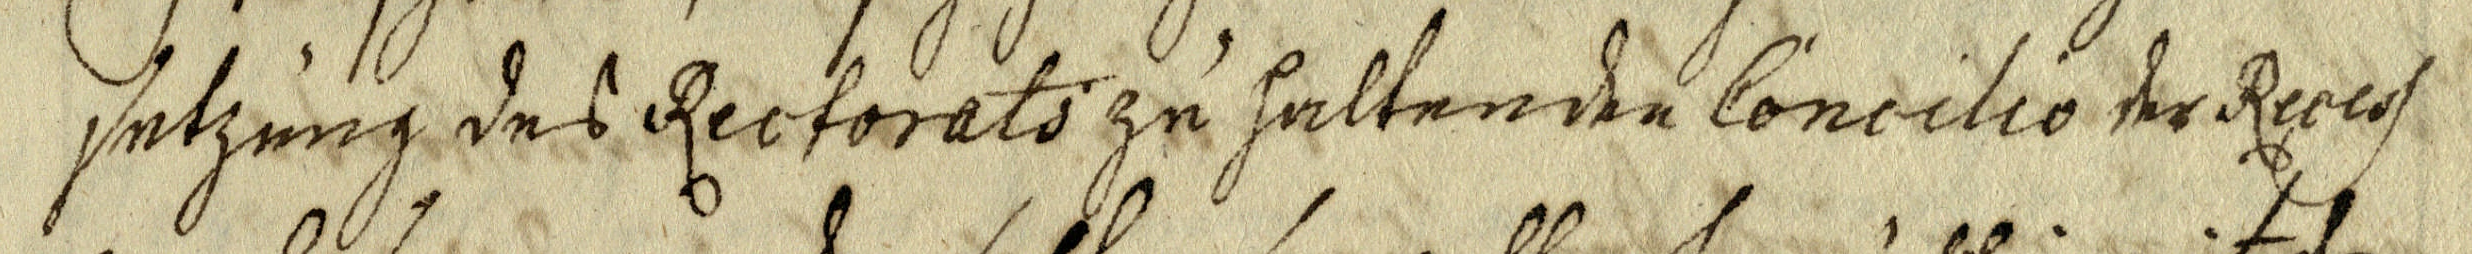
setzung des Rectorats zu haltenden Concilio der Recess
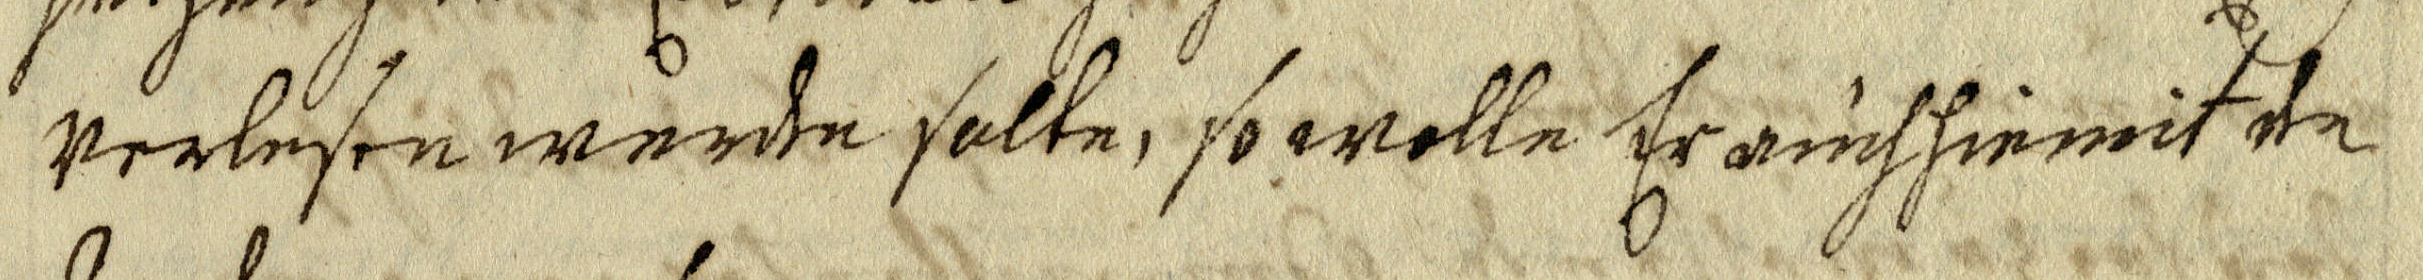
verlesen werden solte, so wolle Er auch hiemit den
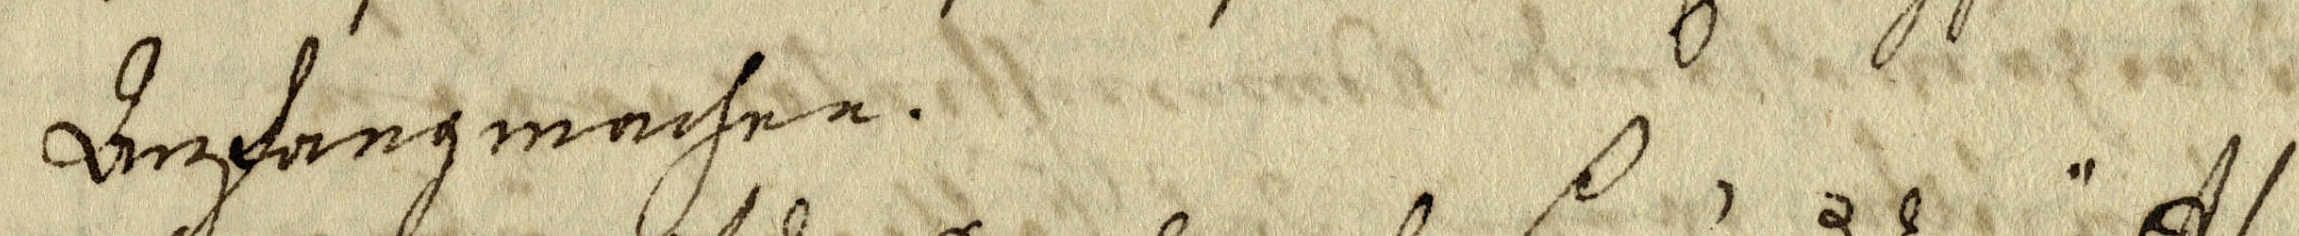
Anfang machen.
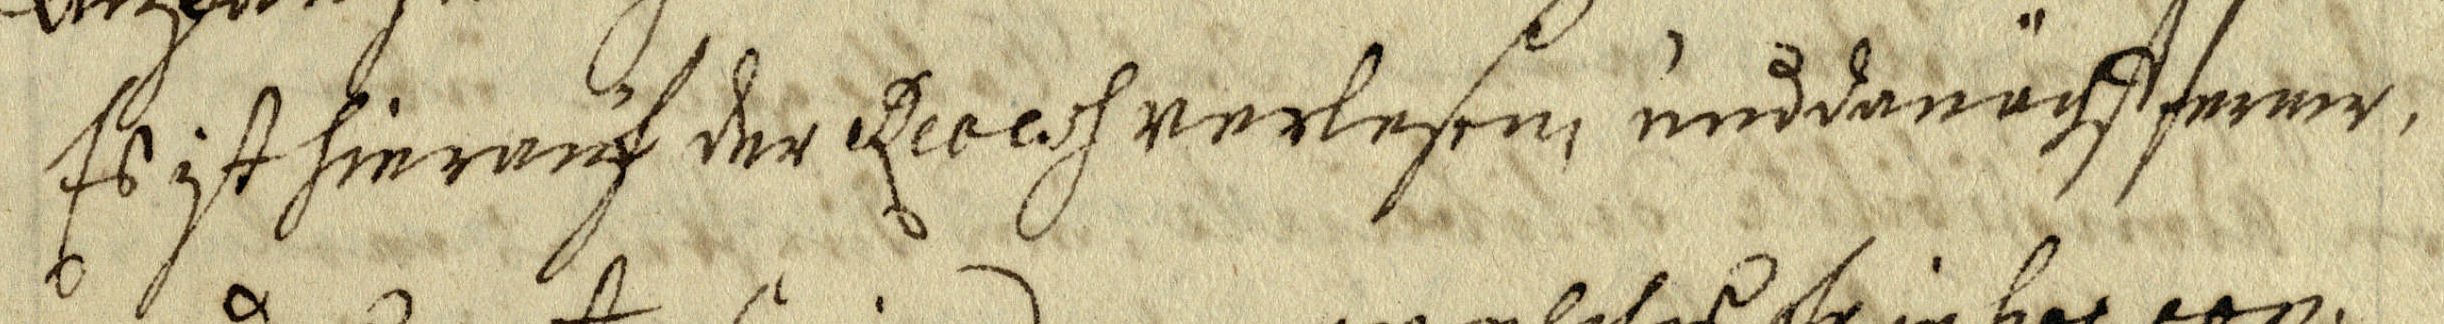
Es ist hierauf der Recess verlesen, und danächst ferner,
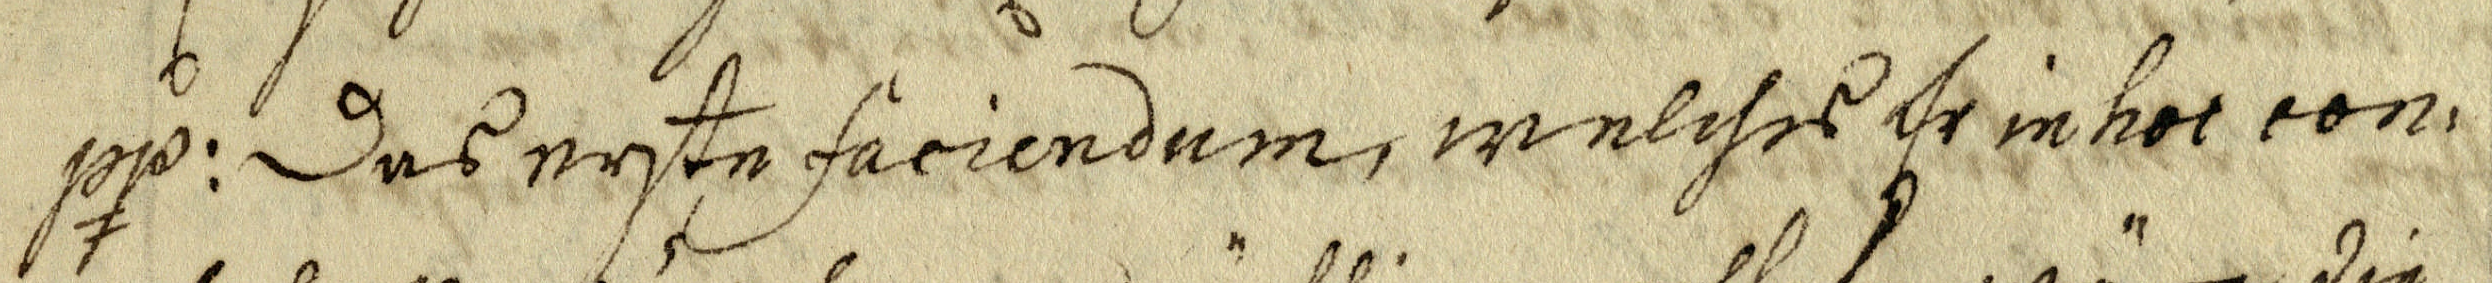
pp: Das erste faciendum, welches Er in hoc con¬
